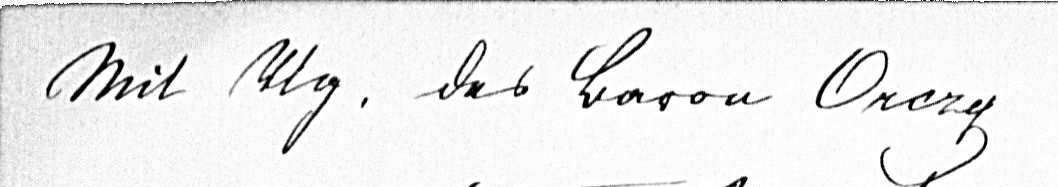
Mit Vg. des Baron Orczy
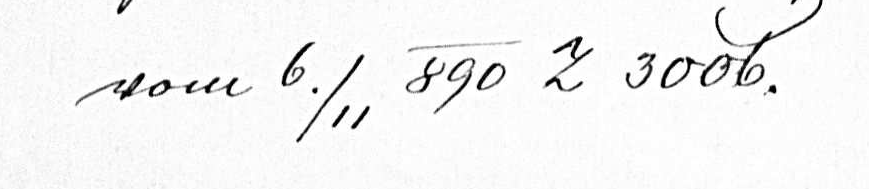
vom 6./11 890 Z 3006.
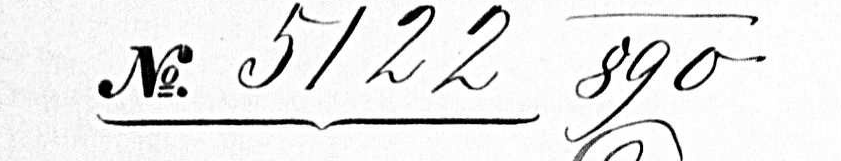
No. 5122 890
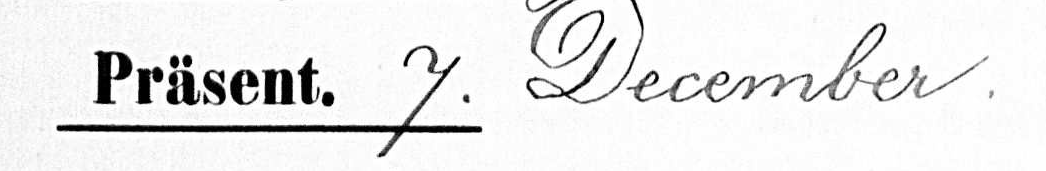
Präsent. 7. December.
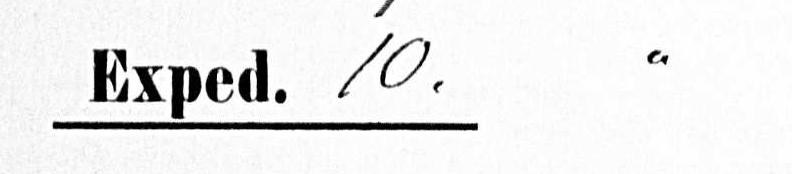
Exped. 10. December.
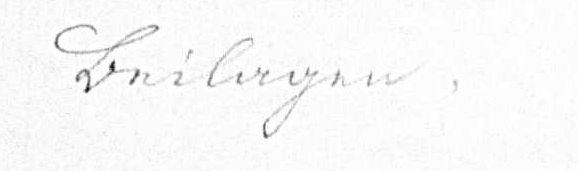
Beilagen.
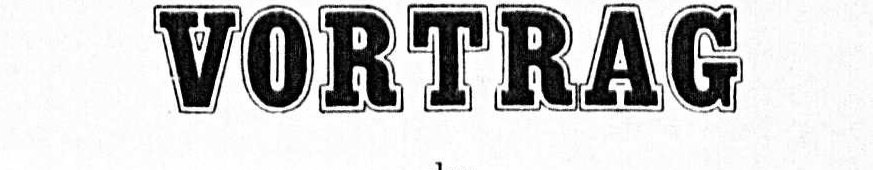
Vortrag
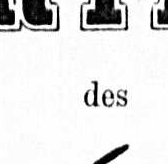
des
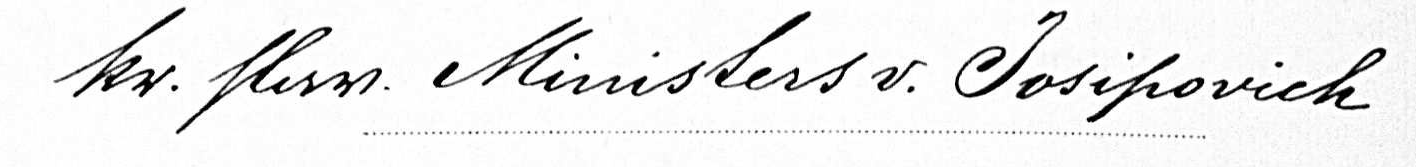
kr. slav. Ministers v. Josipovich
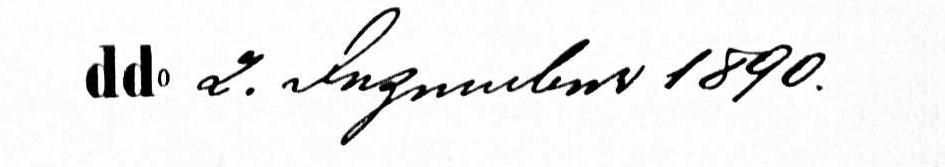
ddo 2. Dezember 1890.
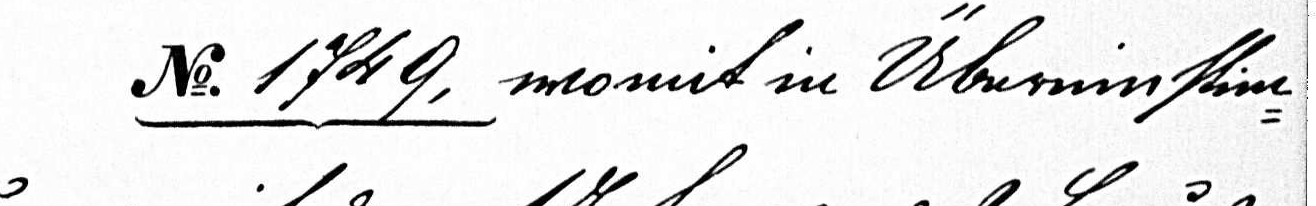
No. 1749, womit in Übereinstim¬
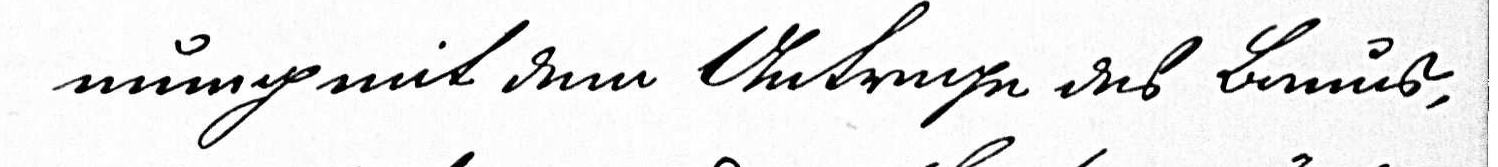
mung mit dem Antrage des Banus,
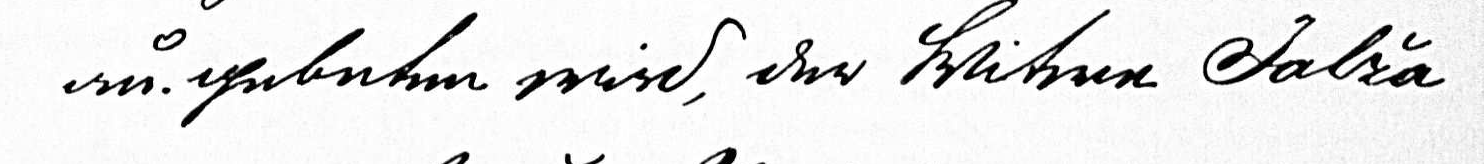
au. gebeten wird, der Witwe Jalža
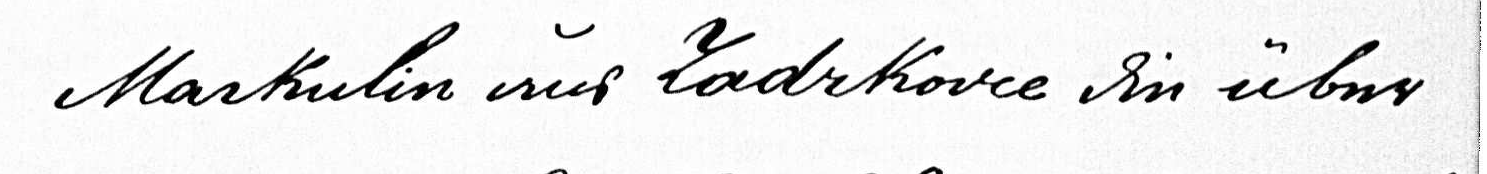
Markulin aus Zadrkovce die über
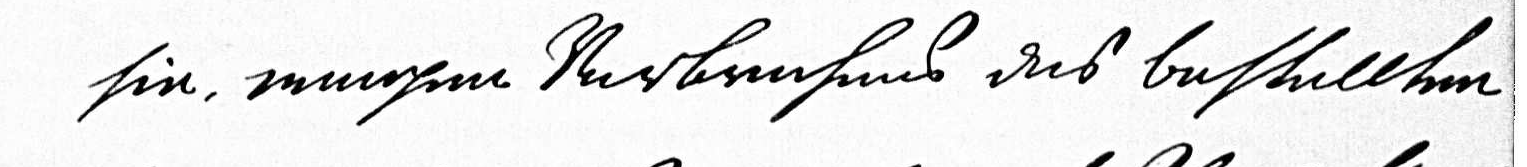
sie, wegen Verbrechens des bestallten
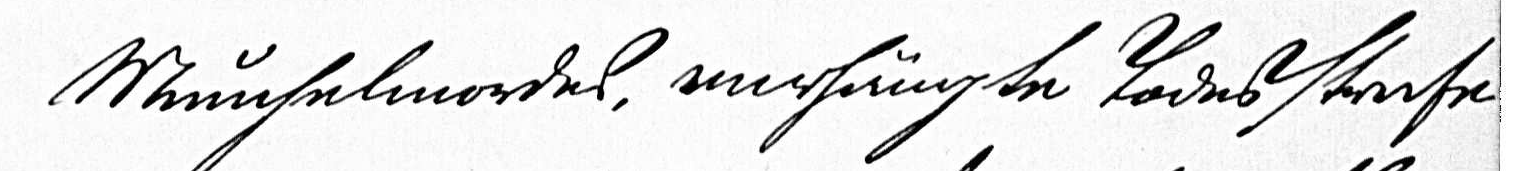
Meuchelmordes, verhängte Todesstrafe
